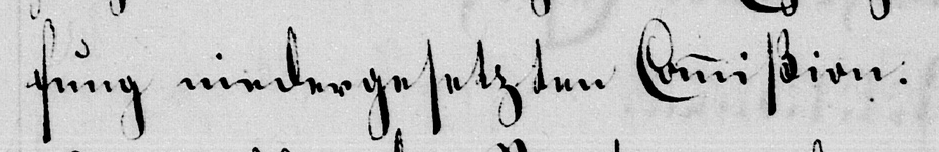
fung niedergesetzten Commißion.
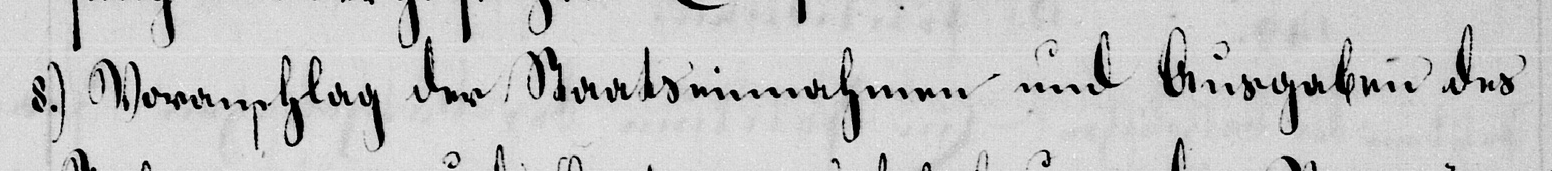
8.) Voranschlag der Staatseinnahmen und Ausgaben des
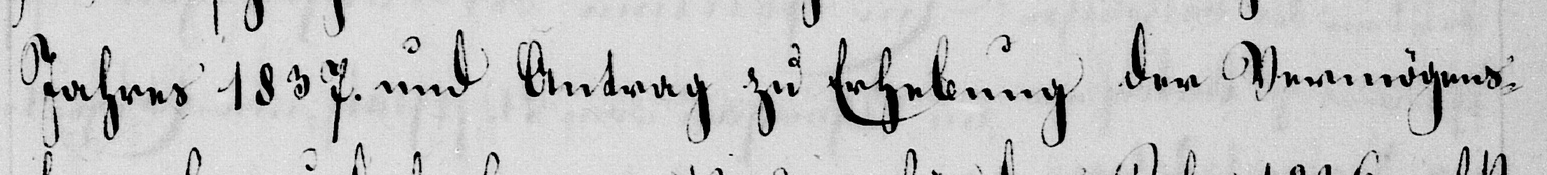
Jahres 1837. und Antrag zu Erhebung der Vermögens-
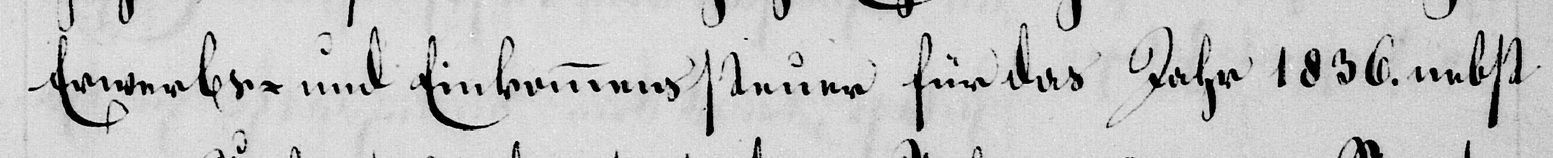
Erwerbs- und Einkommenssteuer für das Jahr 1836. nebst
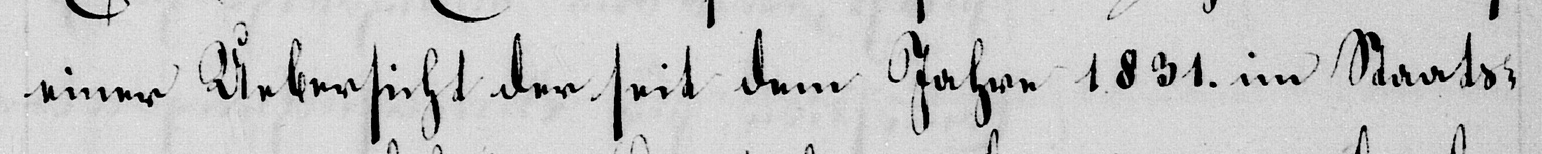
einer Uebersicht der seit dem Jahre 1831. im Staats¬
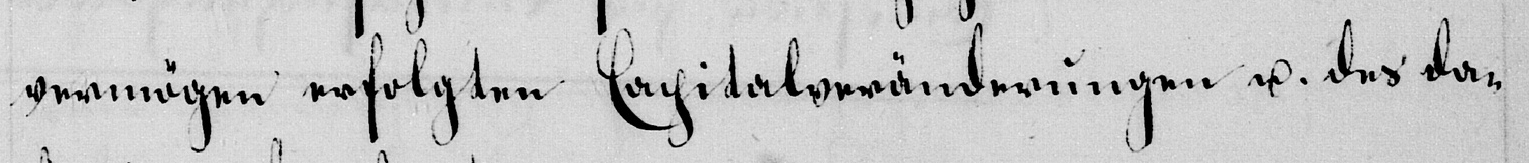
vermögen erfolgten Capitalveränderungen u. des da¬
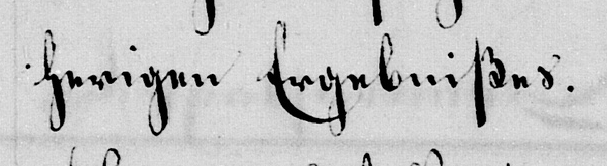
herigen Ergebnißes.
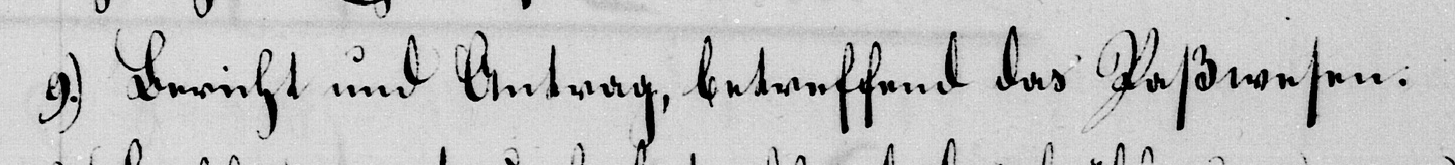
9.) Bericht und Antrag, betreffend das Paßwesen.
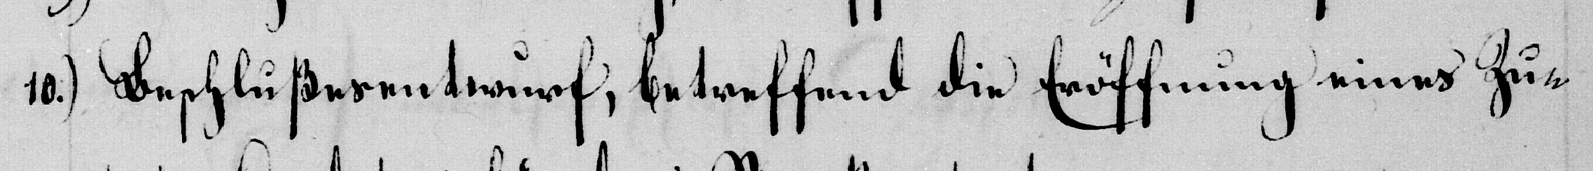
10.) Beschlußesentwurf, betreffend die Eröffnung eines Zu¬
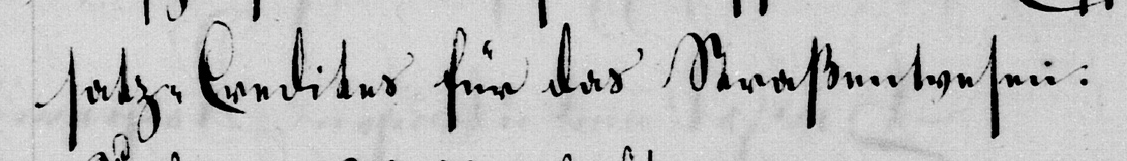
satz-Credites für das Straßenwesen.
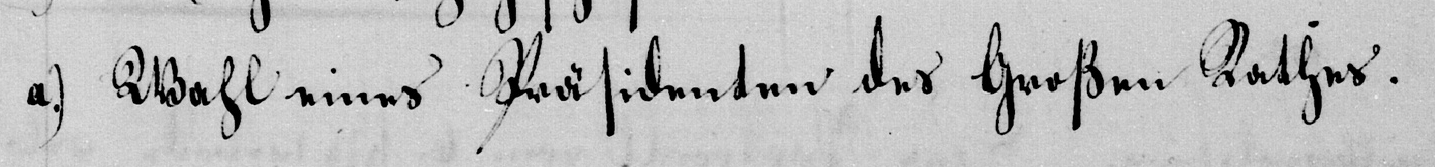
a.) Wahl eines Präsidenten des Großen Rathes.
